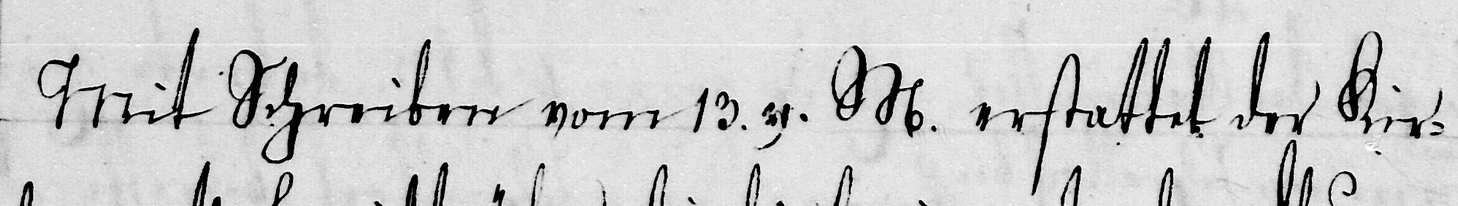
Mit Schreiben vom 13. v. M. erstattet der Kir¬
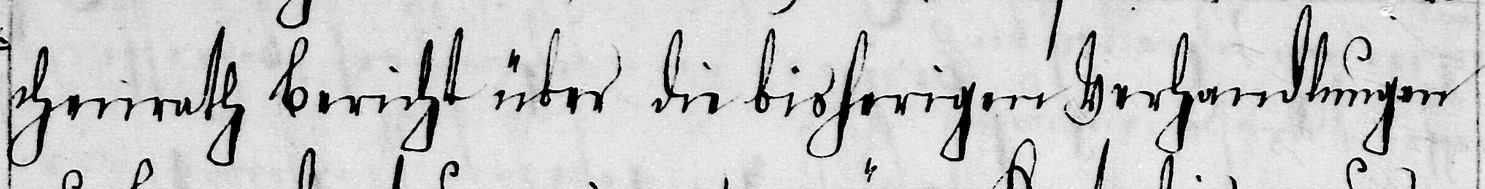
chenrath Bericht über die bisherigen Verhandlungen
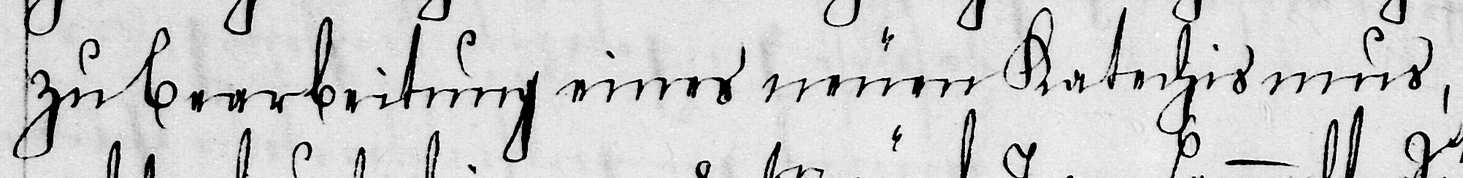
zu Bearbeitung eines neuen Katechismus,
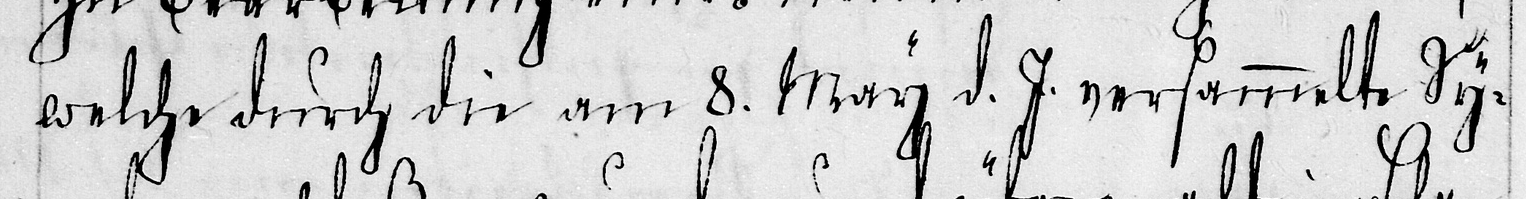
welche durch die am 8. May d. J. versammelte Sy¬
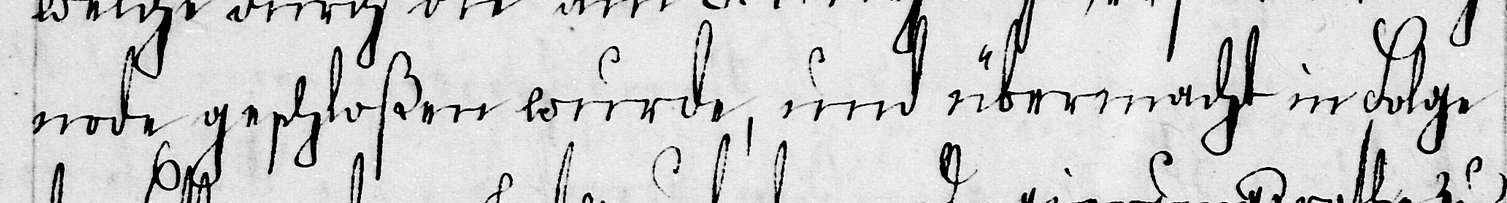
node geschloßen wurde, und übermacht in Folge
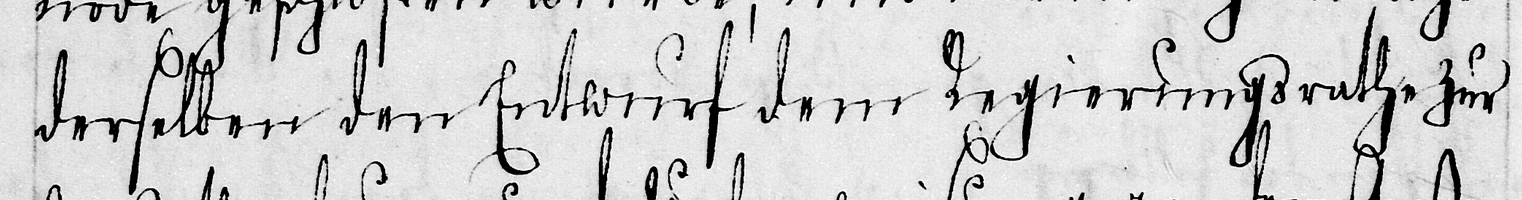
derselben den Entwurf dem Regierungsrathe zur
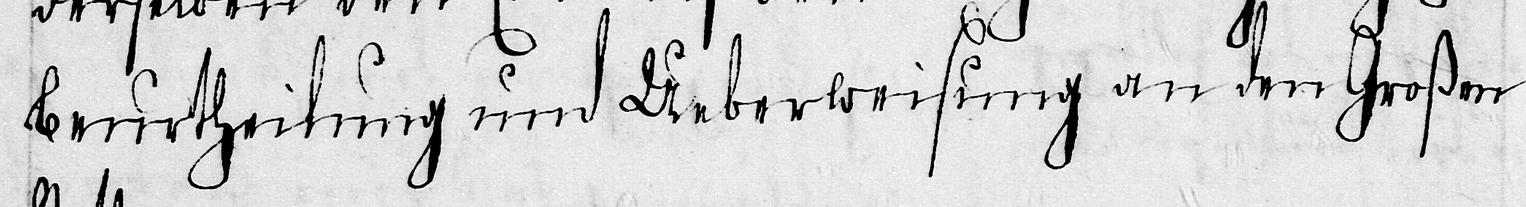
Beurtheilung und Ueberweisung an den Großen
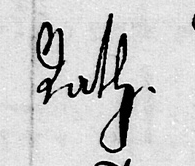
Rath.
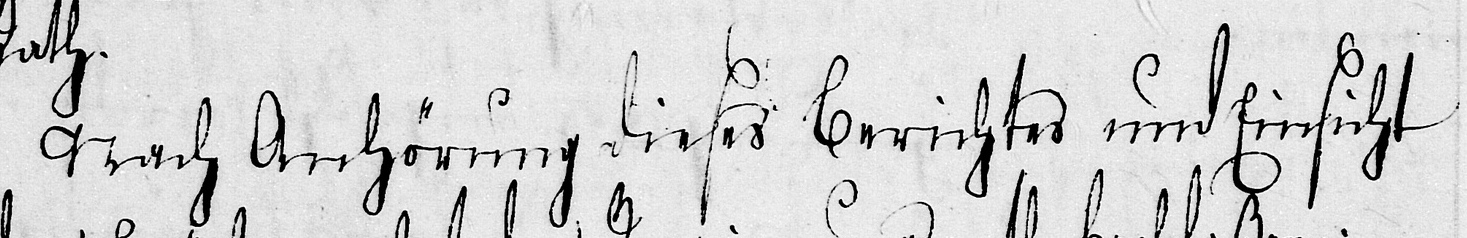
Nach Anhörung dieses Berichtes und Einsicht
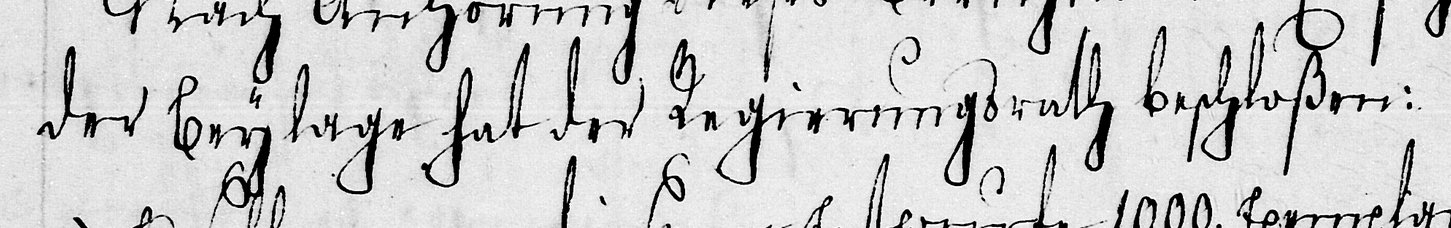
der Beylage hat der Regierungsrath beschloßen:
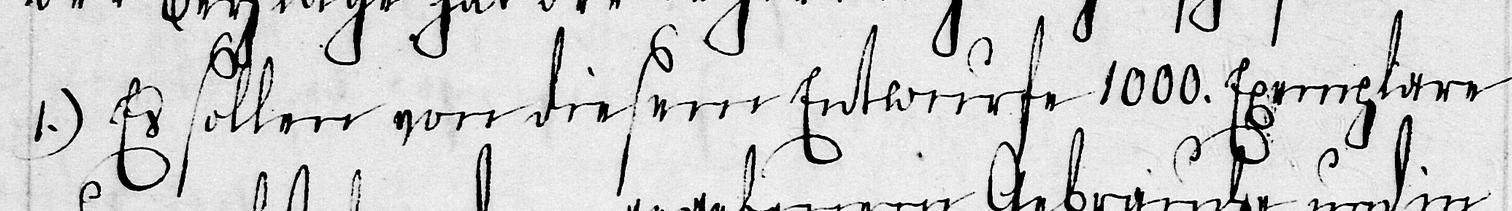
1.) Es sollen von diesem Entwurfe 1000. Exemplare
